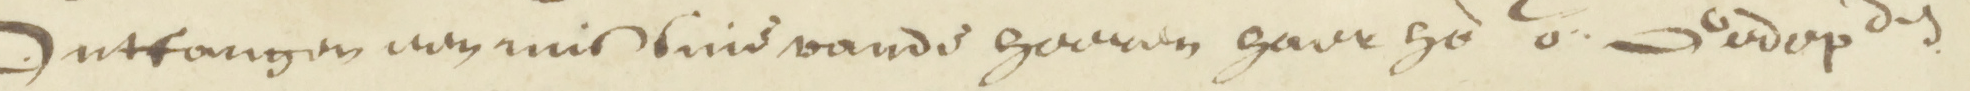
Ontfangen een missiue vande heeren haer hoMo: Gedepden
